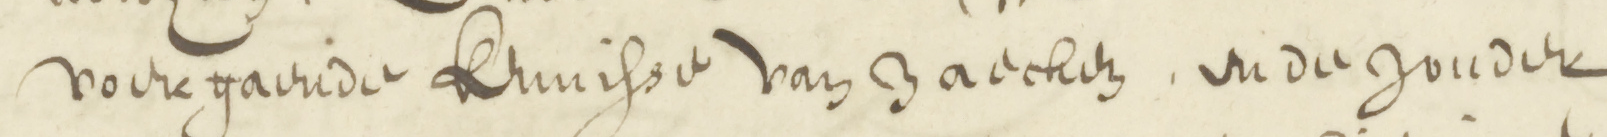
voergaende kennisse van zaecken, ende zonder
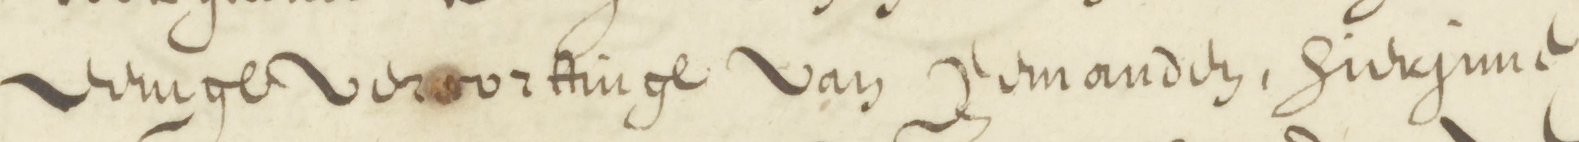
eenige vercortinge van yemanden, hierinne
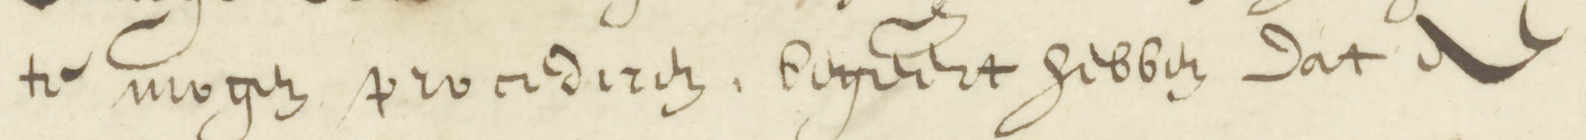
te mogen procediren, begeert hebben dat de
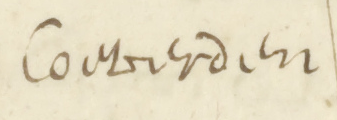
Coeverden
